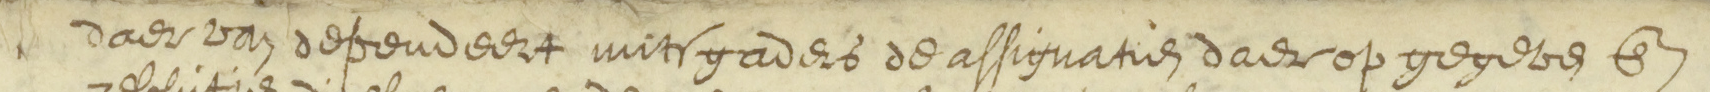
daer van dependeert mitsgaders de assignatien daerop gegeven &
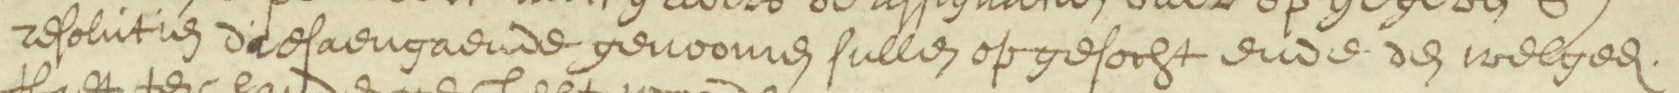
resolutien diesaengaende genoomen sullen opgesocht ende den welgee.
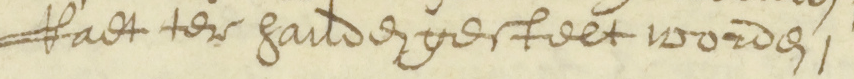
Raet ter handen gestelt worden.
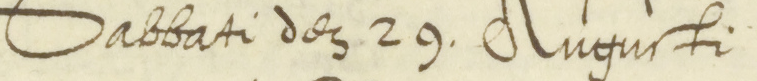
Sabbati den 29. Augusti
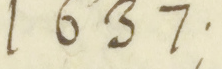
1637.
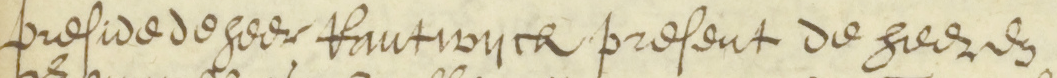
Preside de heer Rantwyck present de heeren
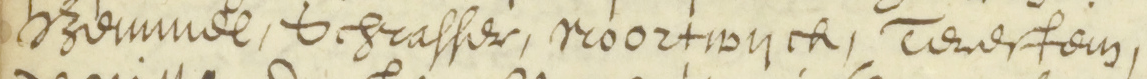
Bemmel, Schrasser, Noortwyck, Terestein,
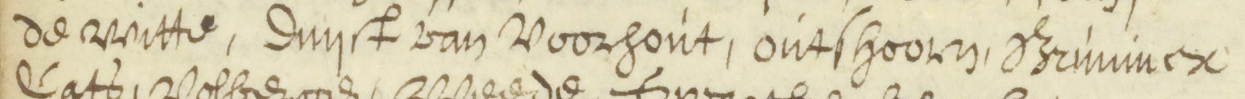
de Witte, Duyst van Voorhout, outshoorn, Brunincx
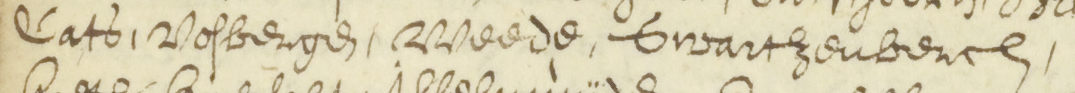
Cats, Vosbergen, Weede, Swartzenberch,
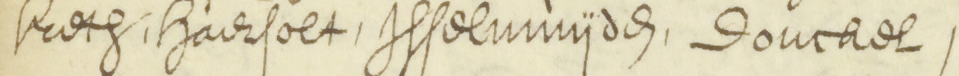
Keth, Haersolt, Isselmuijden, Donckel.
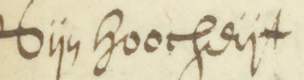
Sijn hoocheijt
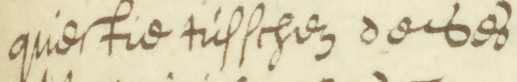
questie tusschen de ses
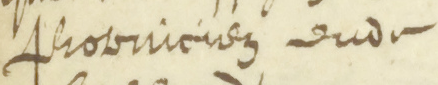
Provincien ende
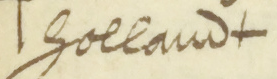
Hollandt
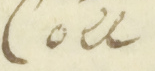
Coll
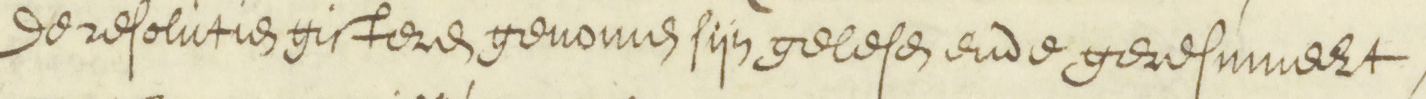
De resolutien gisteren genomen sijn gelesen ende geresumeert
